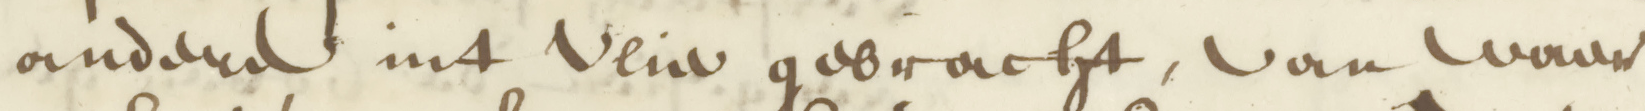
andere int Vlie gebracht, van waer
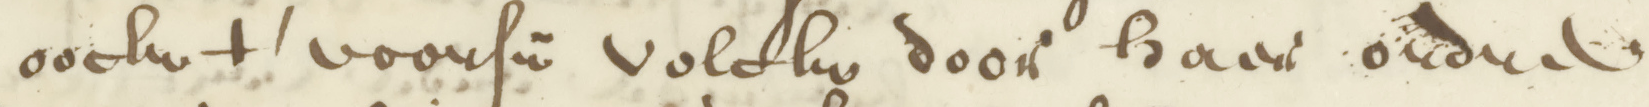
oock t' voorsr volck door haer ordre
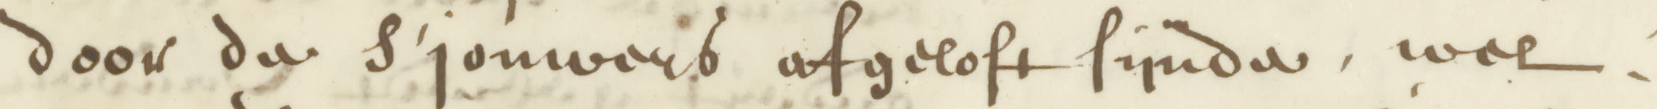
door de s'jouwers afgelost sijnde, wel
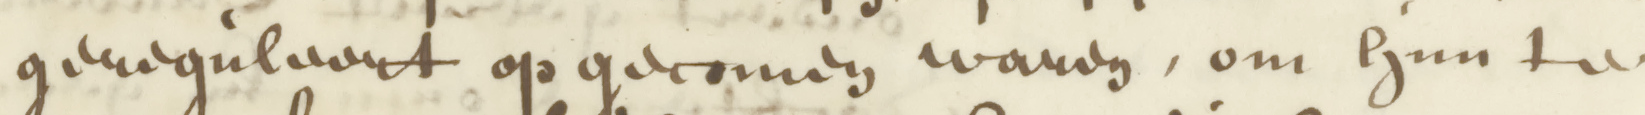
gereguleert op gecomen waren, om hun te
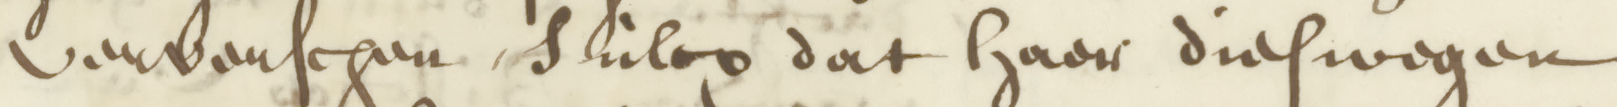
ververschen, sulcx dat haer dieswegen
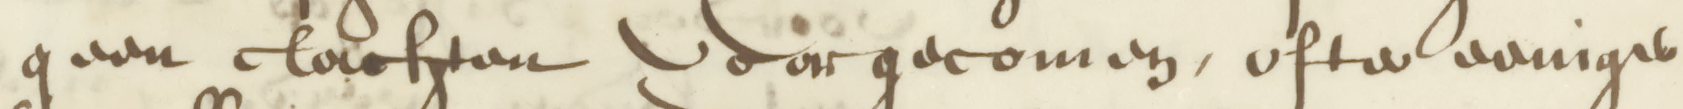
geen clachten voorgecomen, ofte eenige
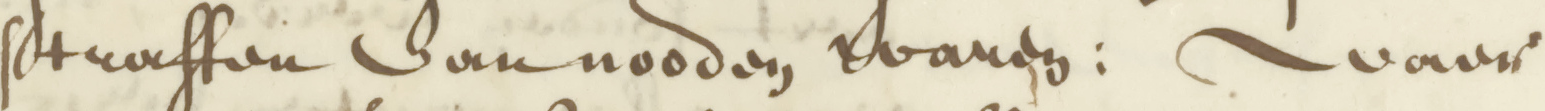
straffen van nooden waren: Waer
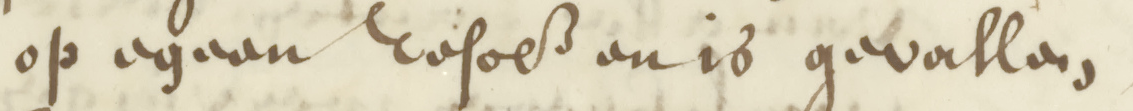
op egeen Resol en is gevallen.
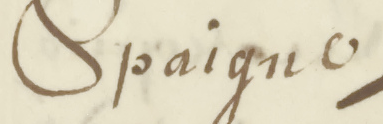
Spaigne
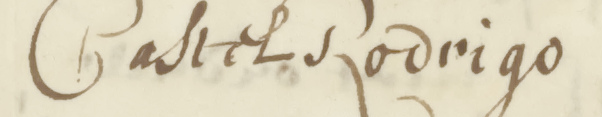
Castel Rodrigo
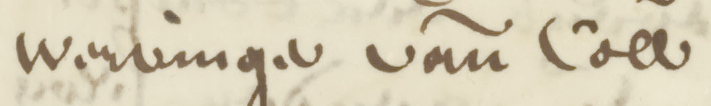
wervinge van Coll
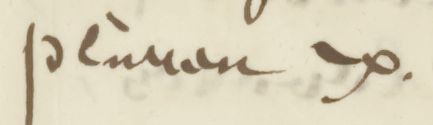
pluren x.
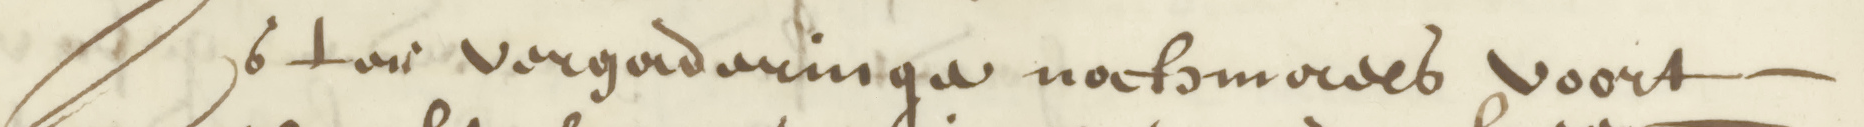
Is ter vergaderinge nochmaels voort-
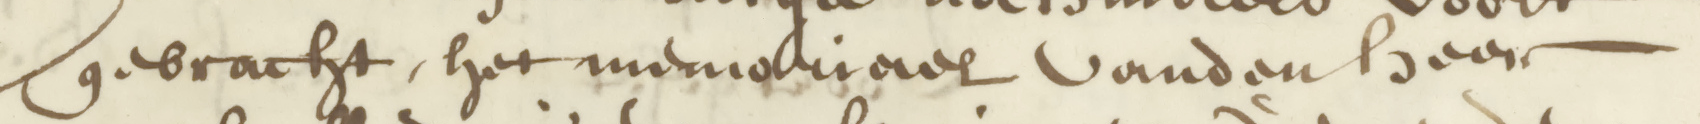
gebracht, het memoriael vanden Heer
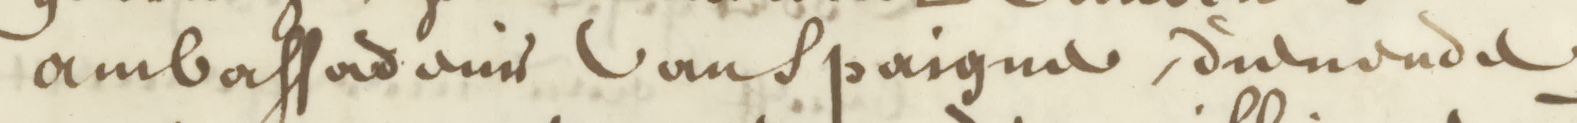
ambassadeur van Spaigne, dienende
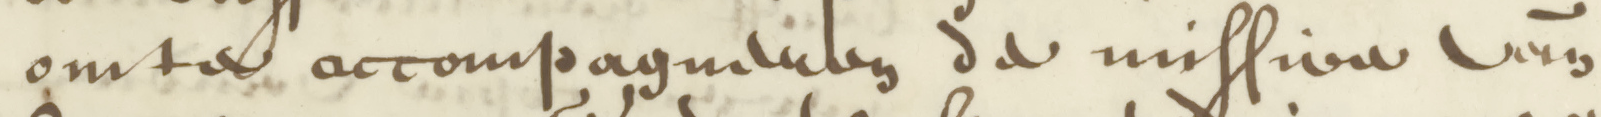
om te accompagneren de missive van
